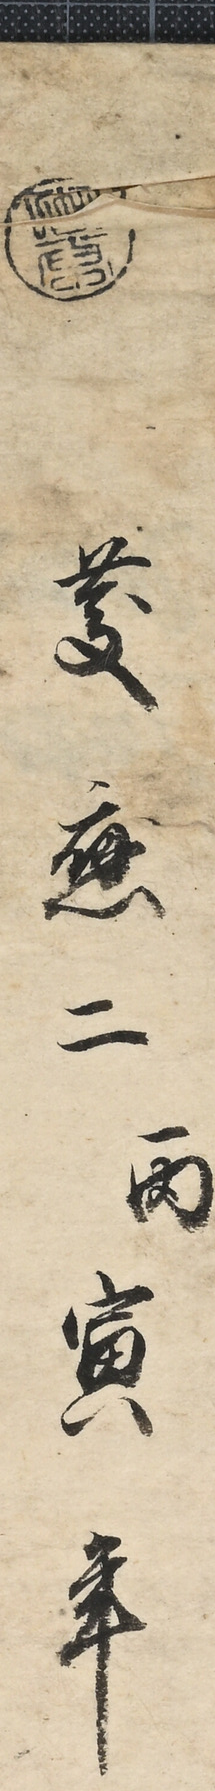㊞慶応二丙寅年
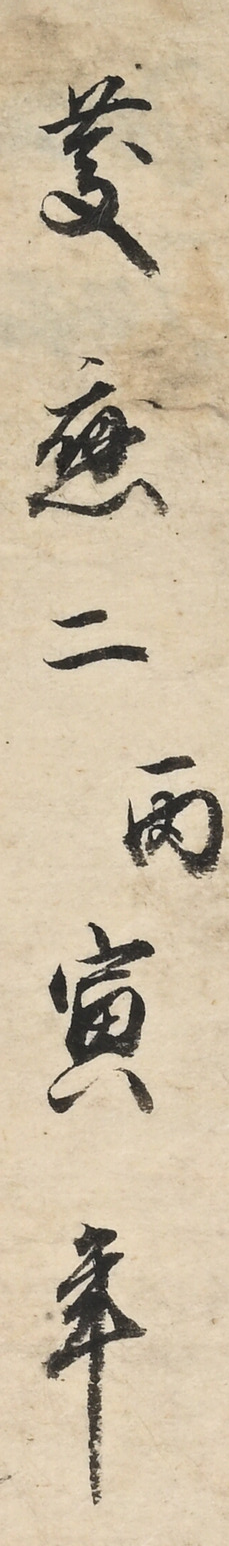㊞慶応二丙寅年
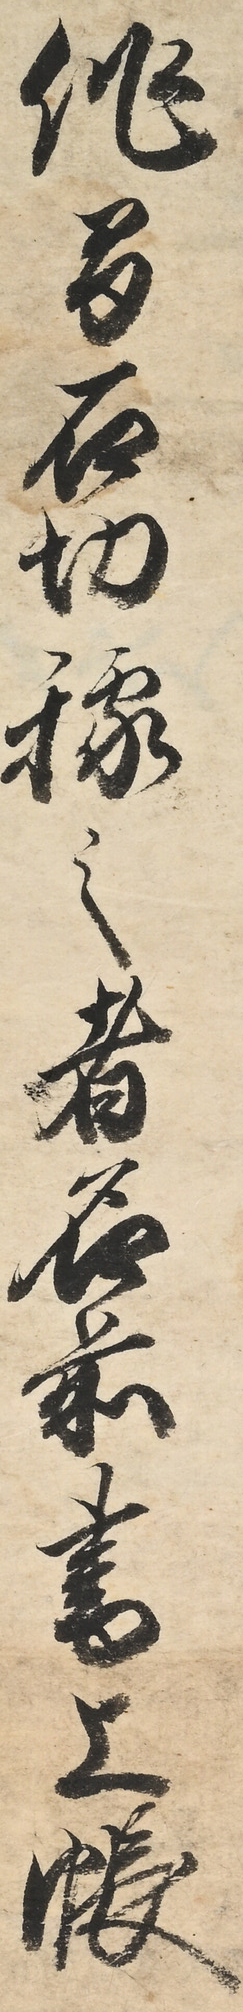作間石切稼之者名前書上帳

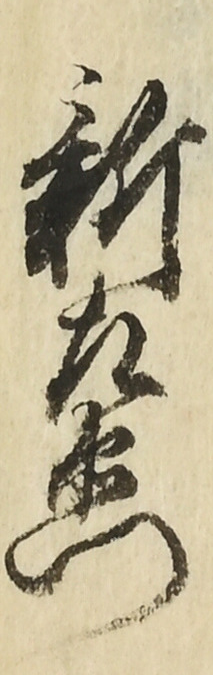新左衛門
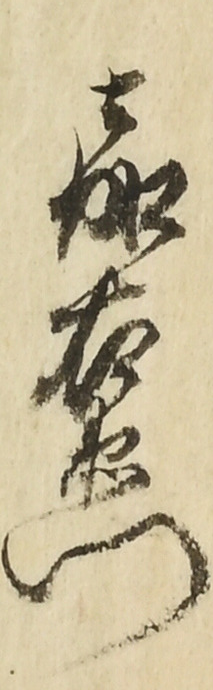嘉右衛門
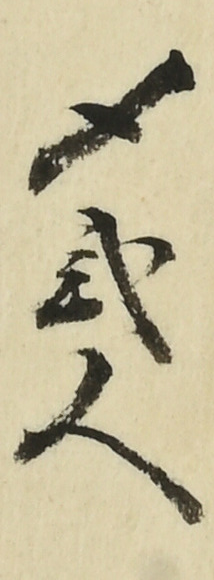〆弐人

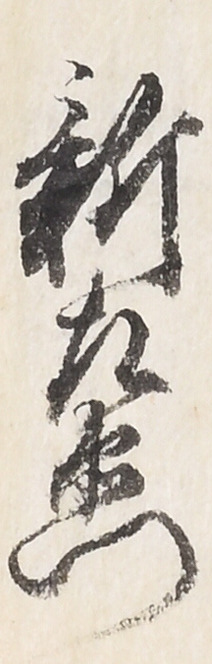新左衛門
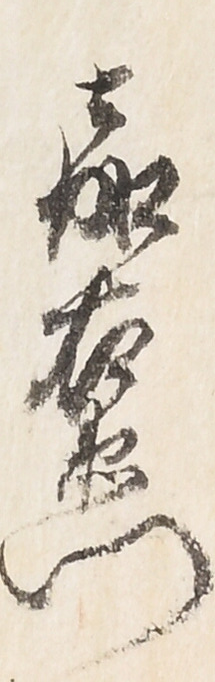嘉右衛門
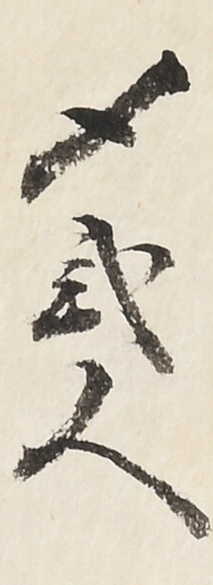〆弐人

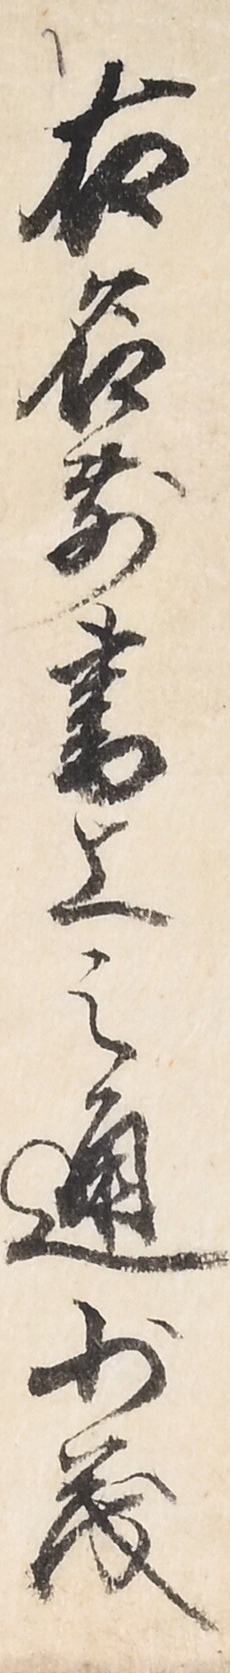右名前書上之通少茂
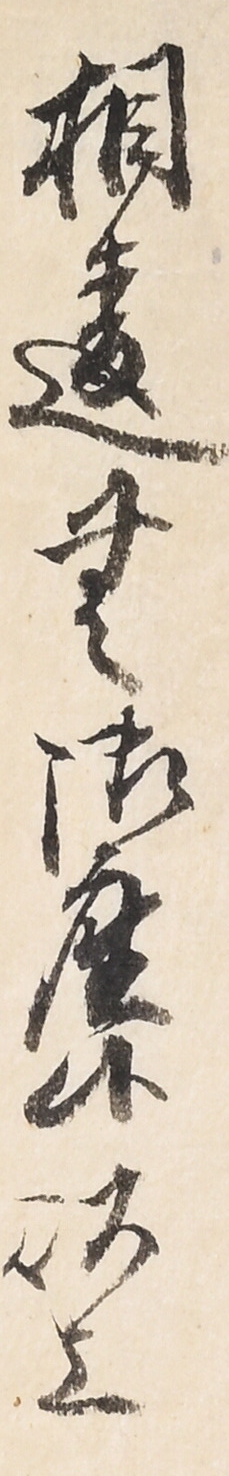相違無御座候以上
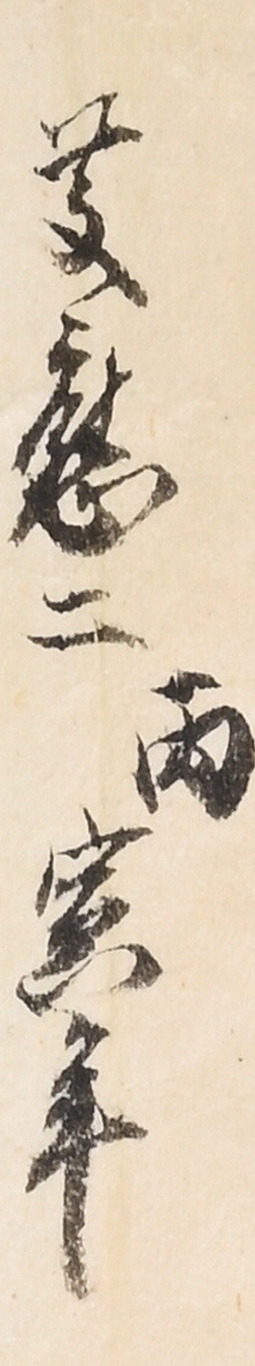慶応二丙寅年
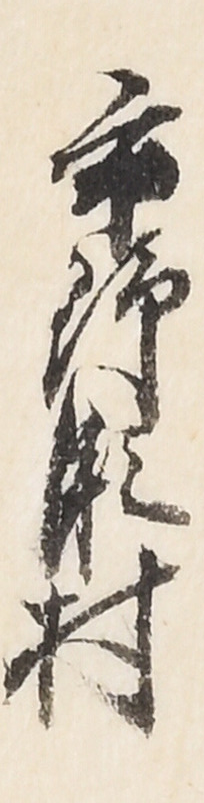市野瀬村
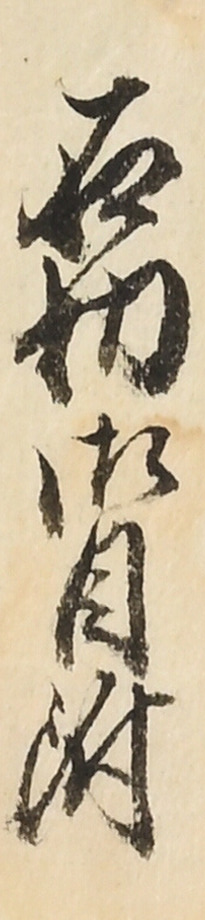石切御目附
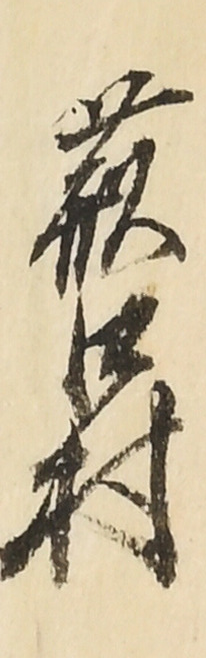荊口村
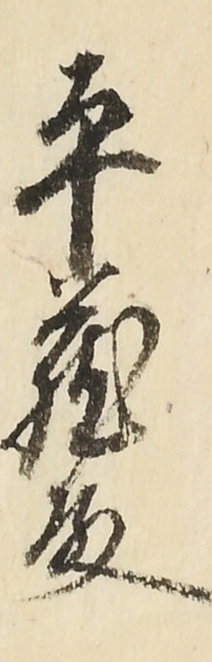平蔵様
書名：慶應二丙寅年三月作間石切稼之者名前書上帳
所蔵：伊那市立高遠町図書館・合同会社AMANE
